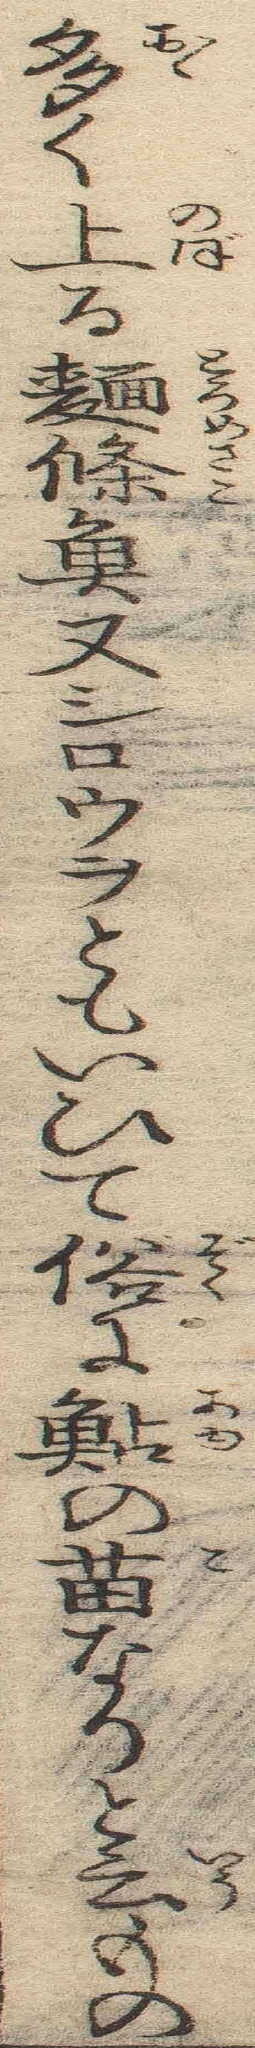多く上る麺條魚又シロウヲともいひて俗に鮎の苗なりと云もの

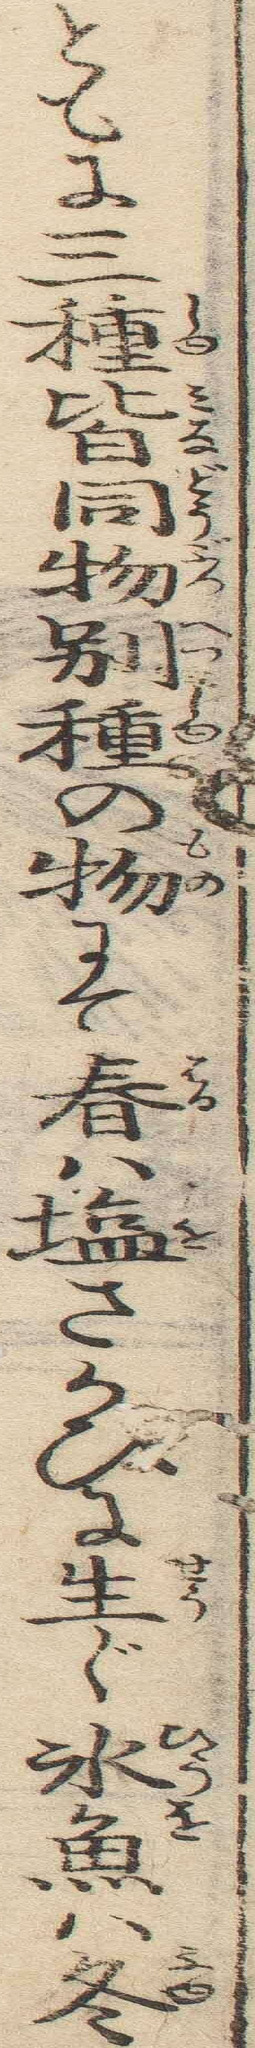ともに三種皆同物別種の物にて春は塩さかひに生じ氷魚は冬
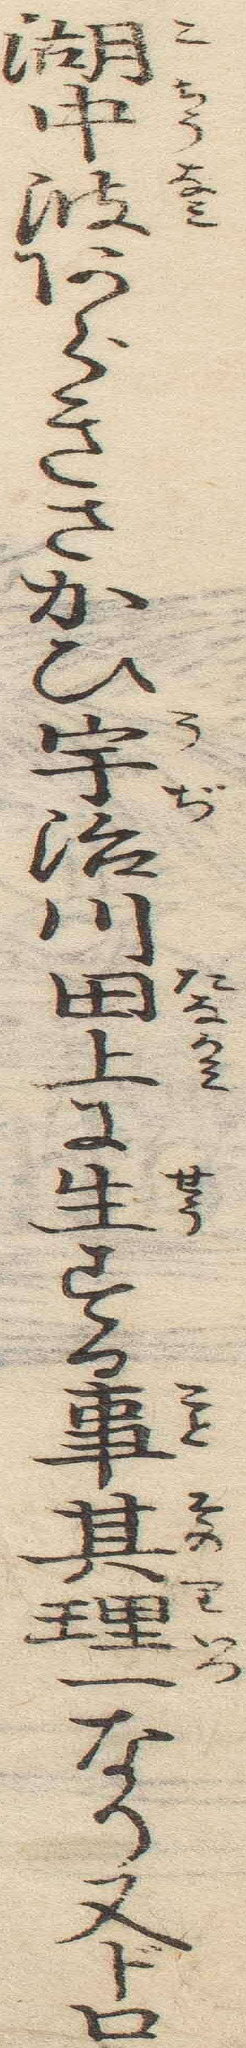湖中波あらきさかひ宇治川田上に生する事其理一なり又ドロ
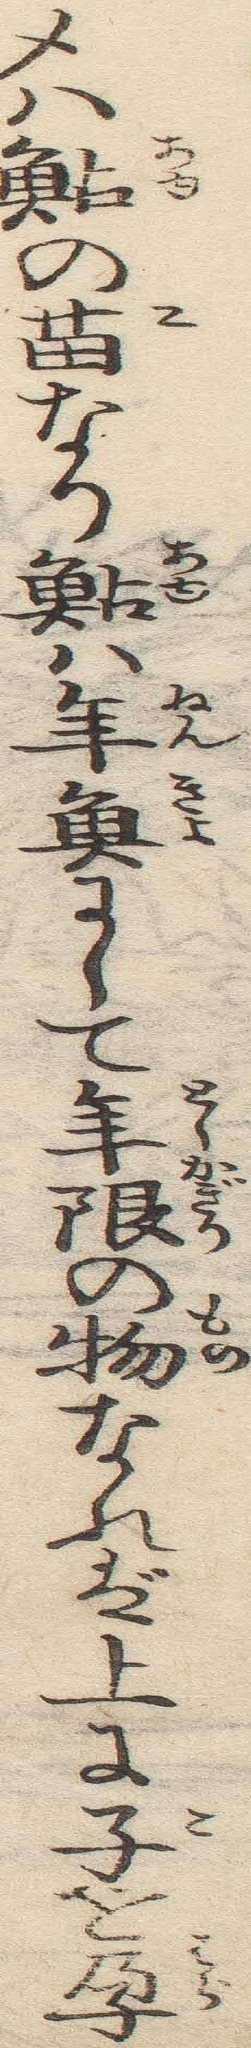メは鮎の苗なり鮎は年魚にして年限の物なれば上に子を孕
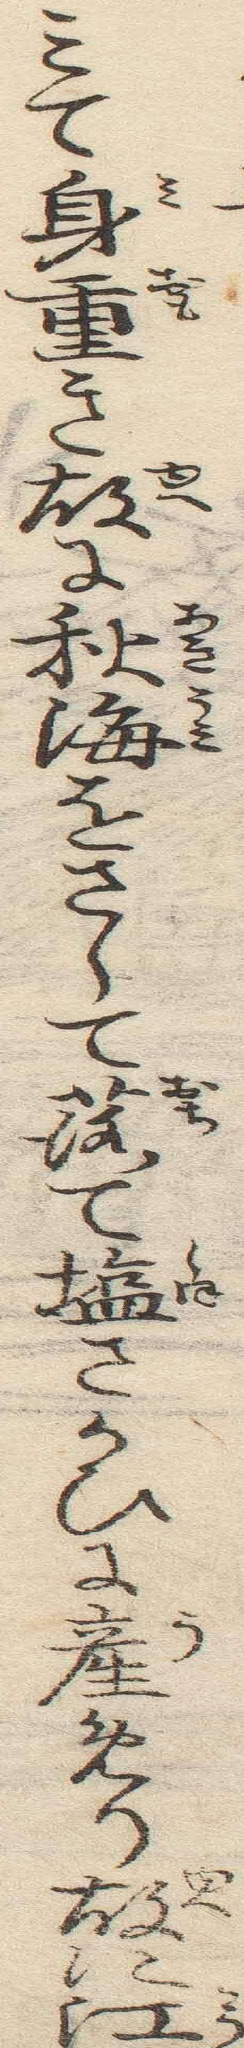みて身重き故に秋海をさして落て塩さかひに産めり故に江
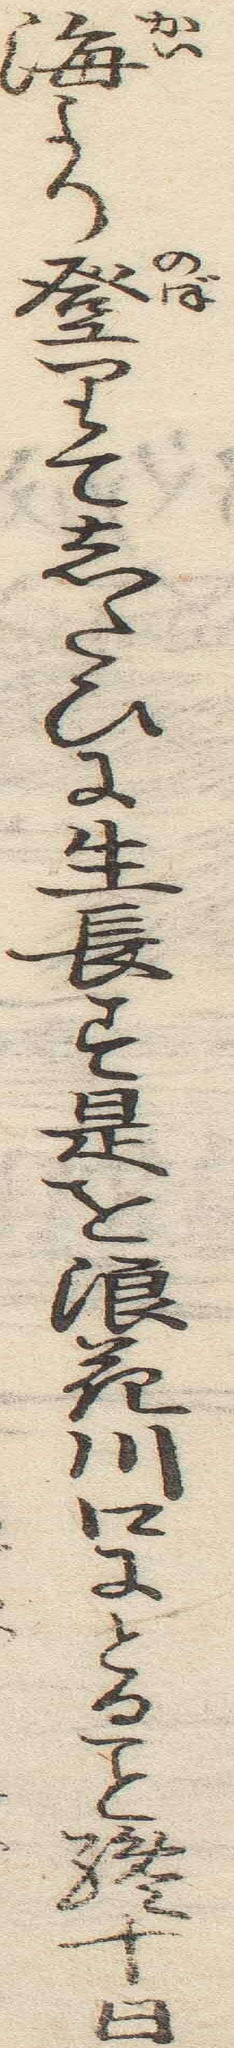海より登りてしたひに生長す是を浪花川口にとること纔十日
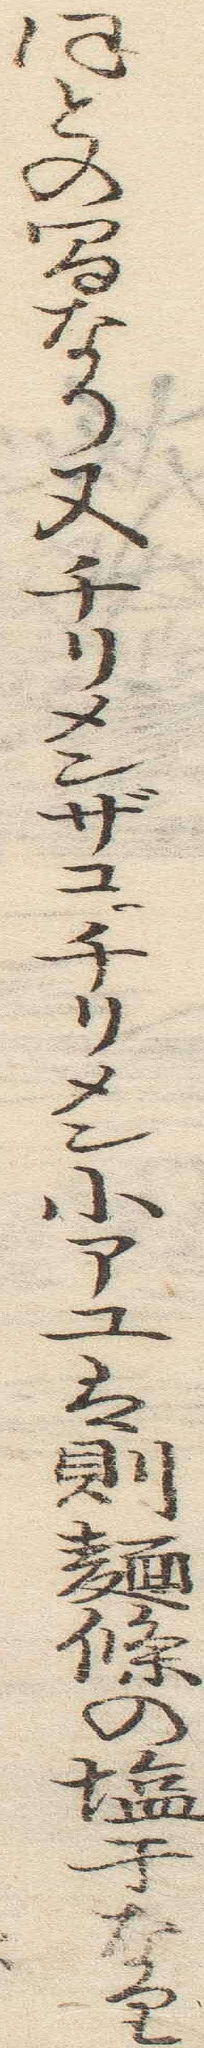ほとの間なり又チリメンザコ。チリメン小アユは則麺條の塩干なり
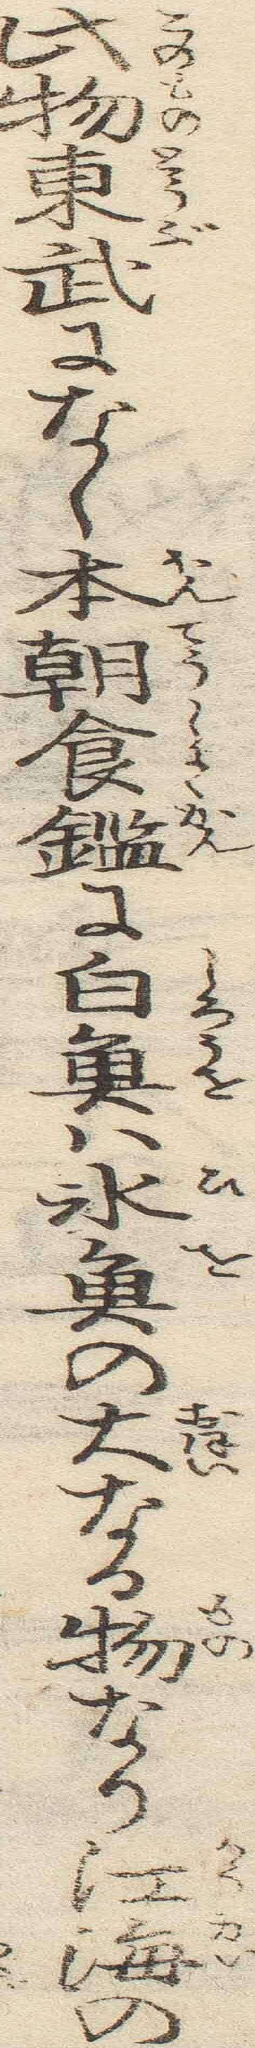此物東武になし本朝食鑑に白魚は氷魚の大なる物なり江海の
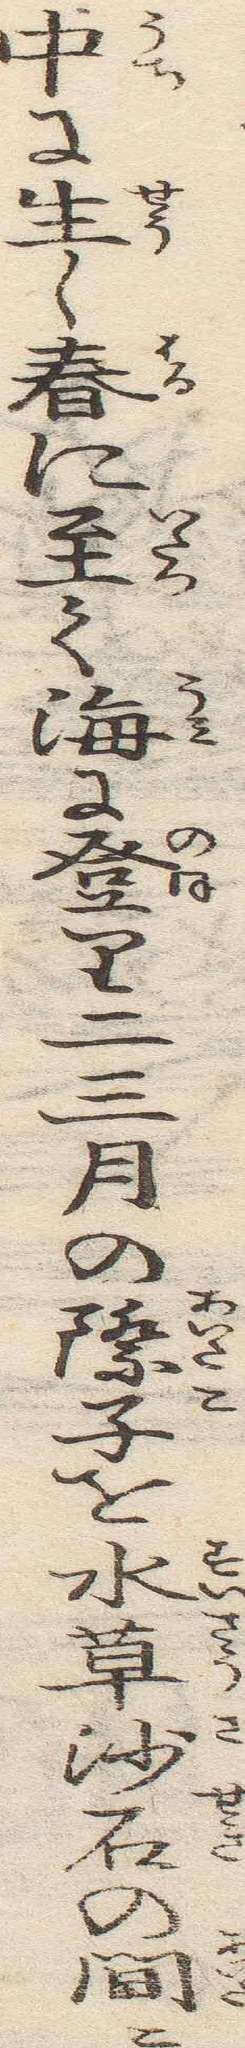中に生し春に至て海に登り二三月の際子を水草沙石の間に
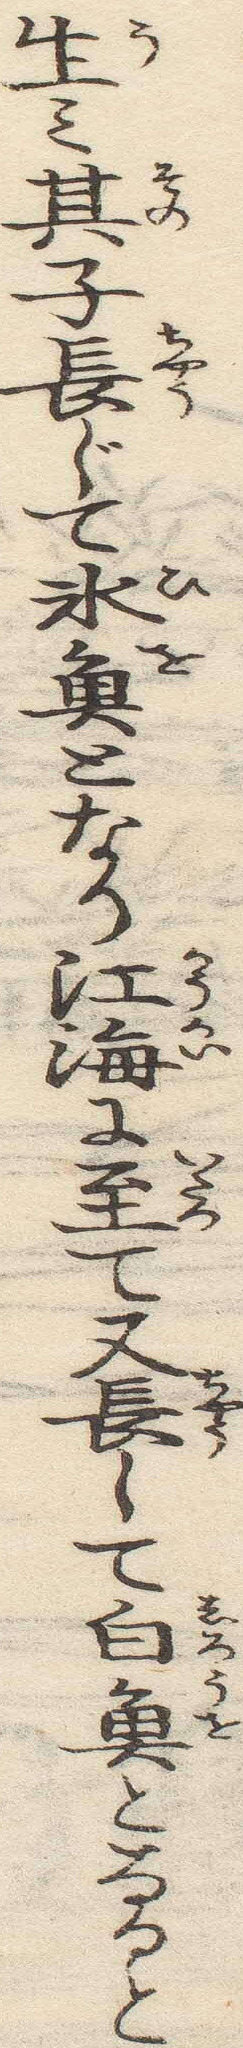生み其子長じて氷魚となり江海に至て又長して白魚となると
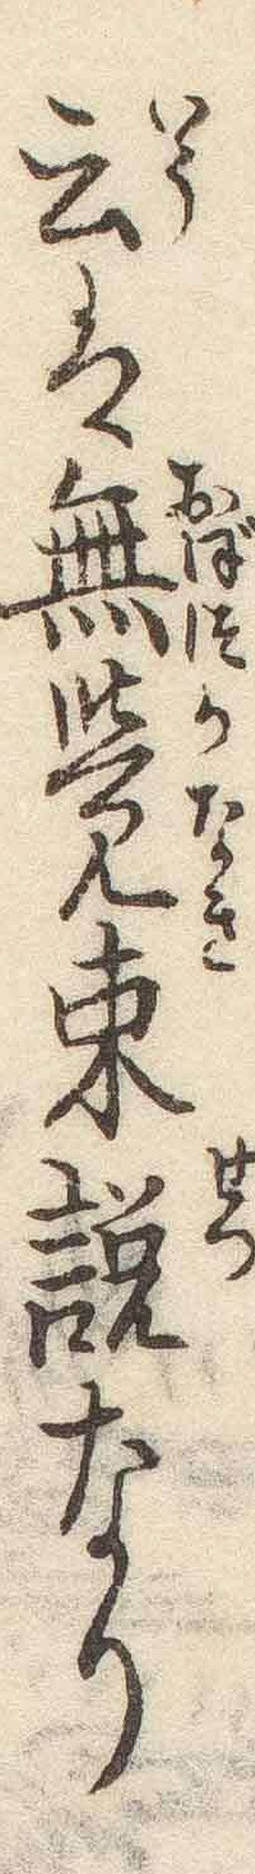云は無覚束説なり
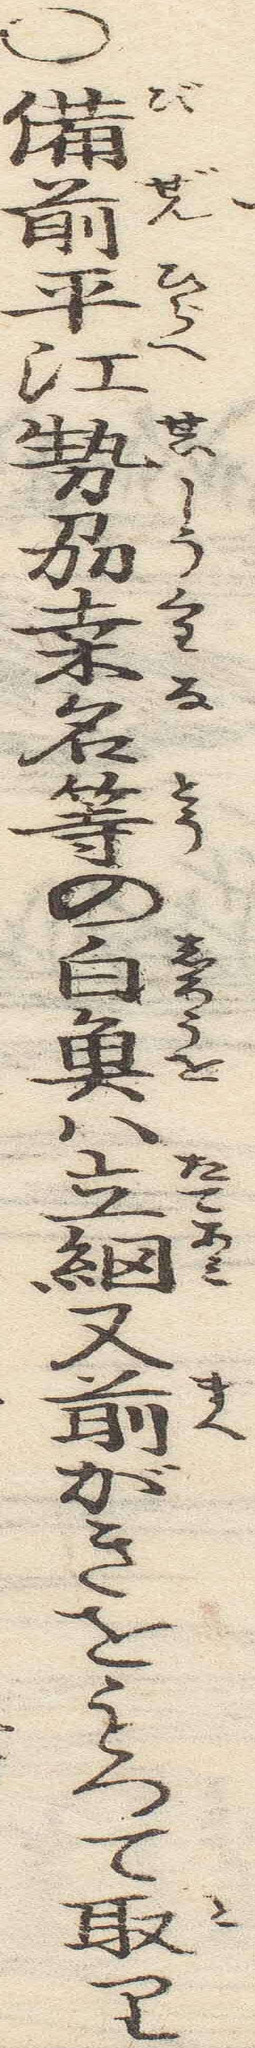○備前平江勢州桑名等の白魚は立網又前がきをもつて取り
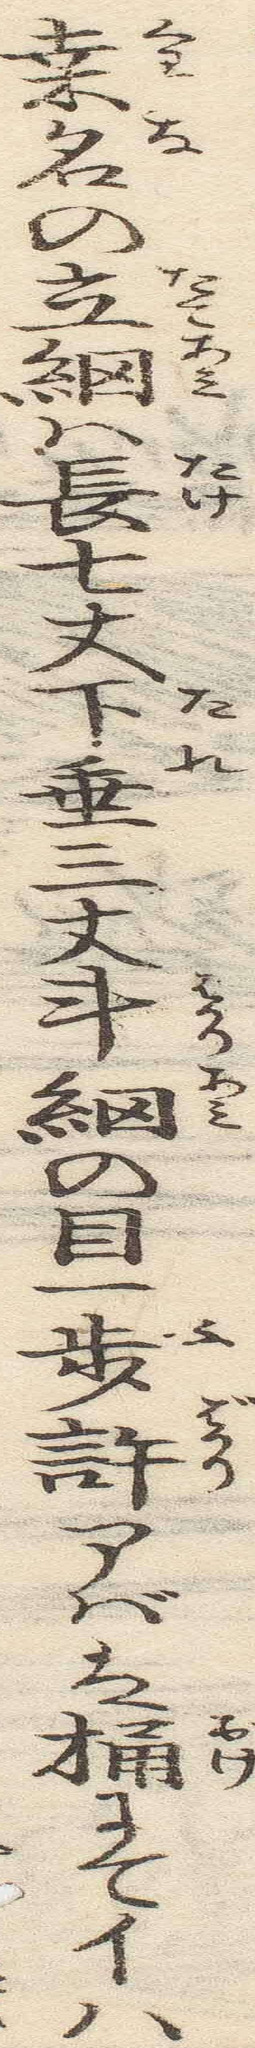桑名の立網は長七丈下垂三丈斗網の目一歩許アバは桶にてイハ
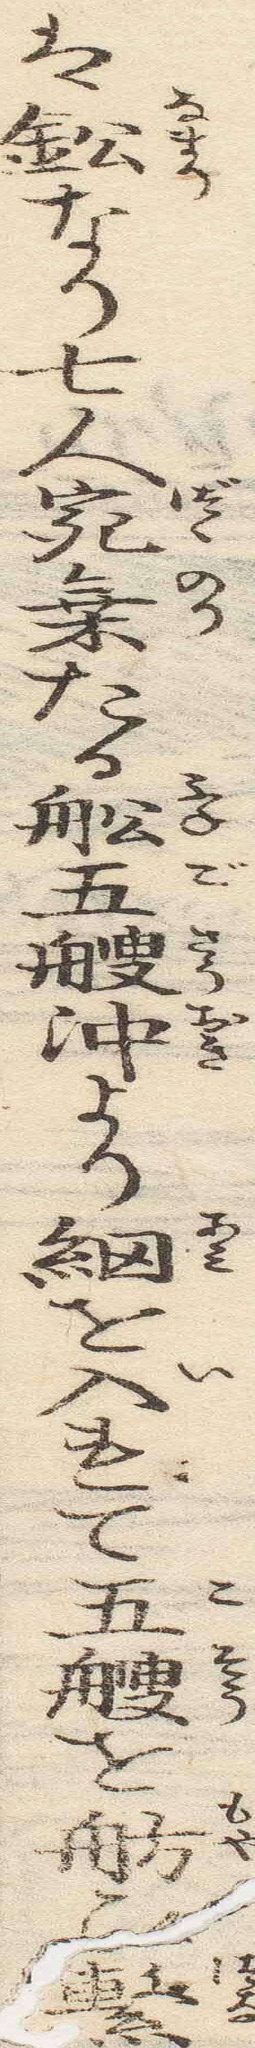は鉛なり七人宛乗たる船五艘沖より網を入れて五艘を舫ひ繋
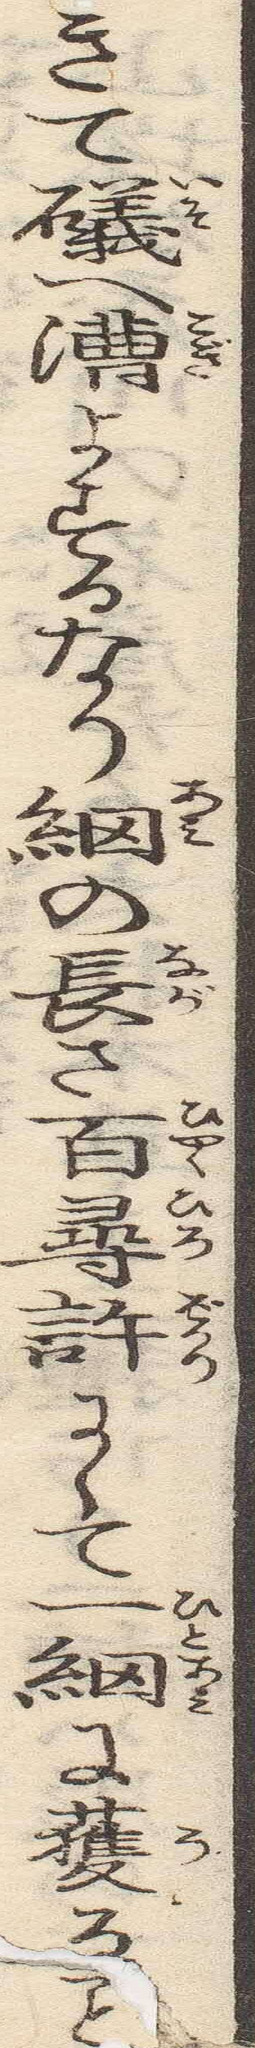きて礒へ漕よするなり網の長さ百尋許にして一網に獲ること
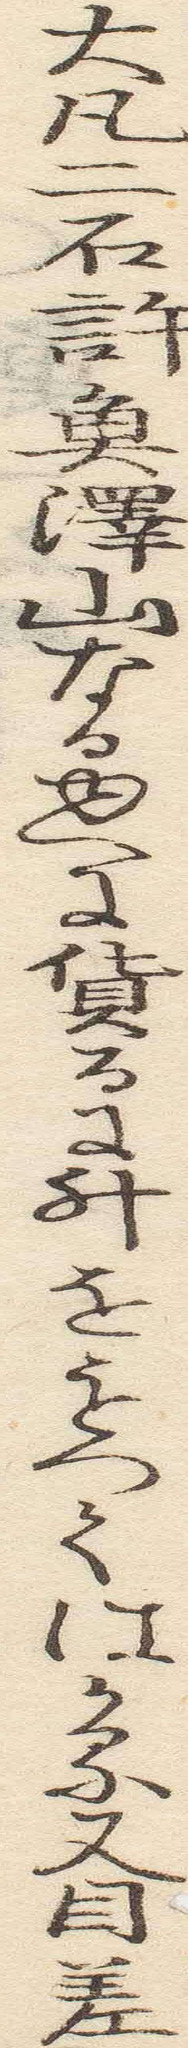大凡二石許魚沢山なるゆへに貨るに升をもつてはかる又目差
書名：日本山海名産図会
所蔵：東京学芸大学附属図書館 国文学研究資料館
